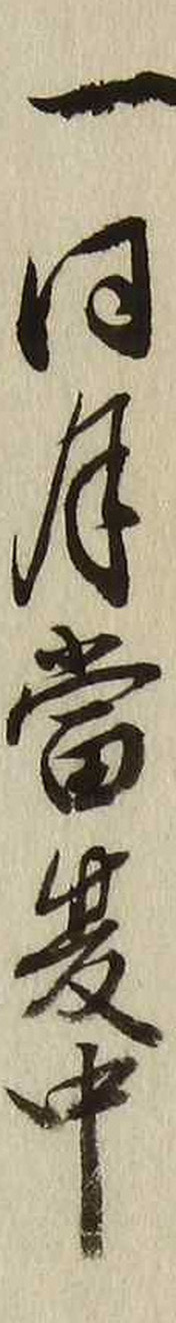一同月当夏中
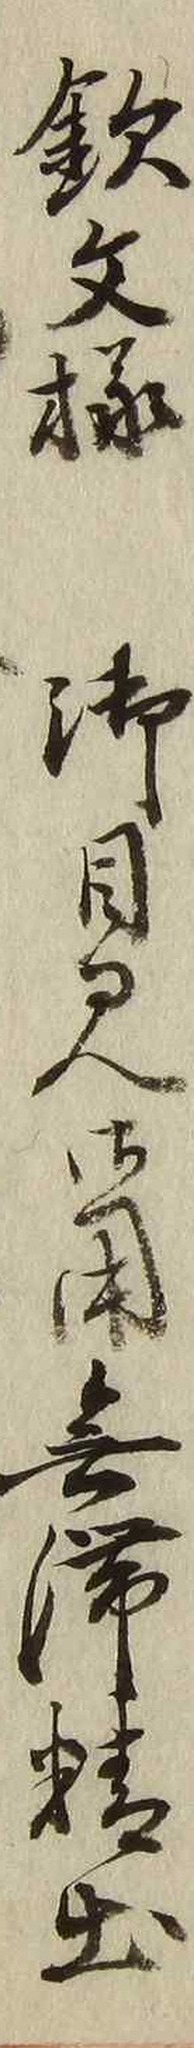欽文様御目見御用無滞精出
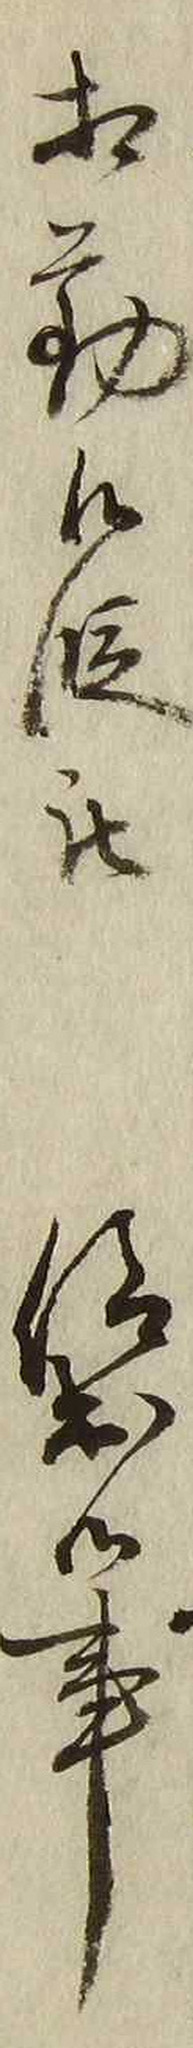相勤候段被仰出候事
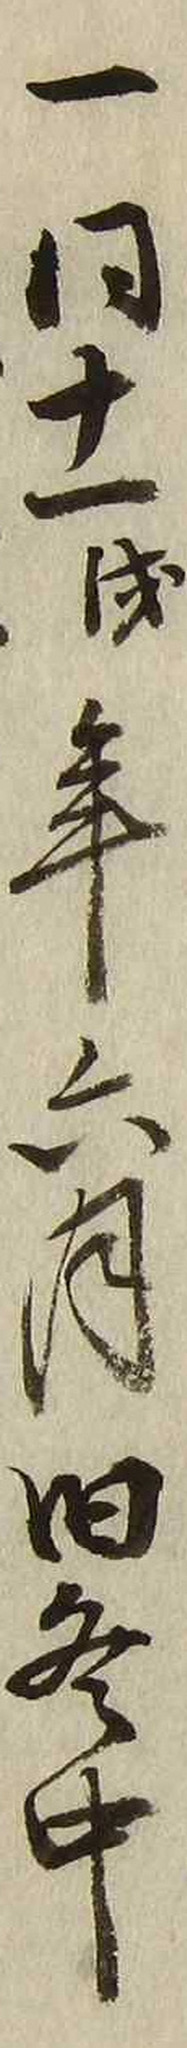一同十一戌年六月旧冬中
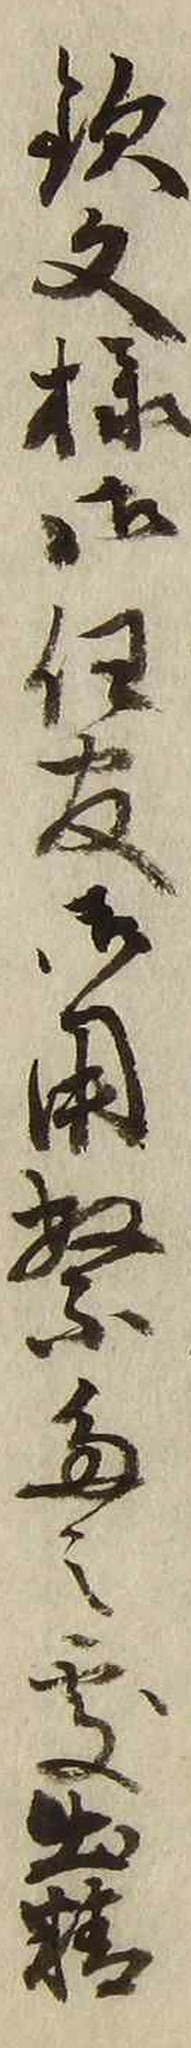欽文様御任官御用繁多之処出精
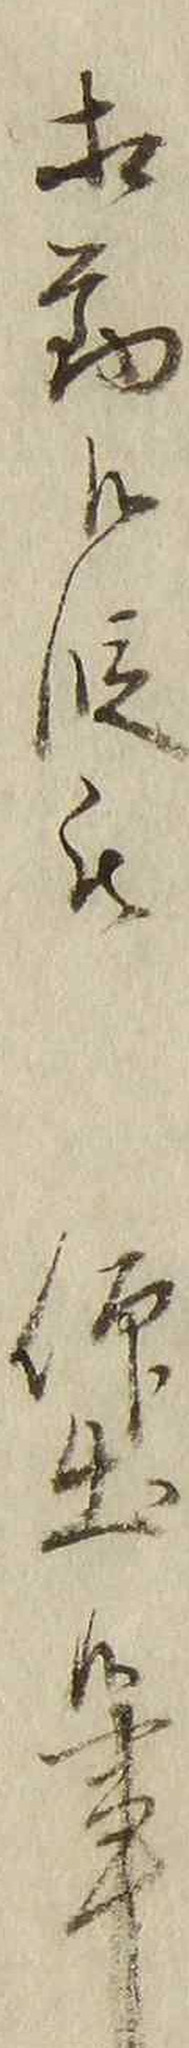相勤候段被仰出候事

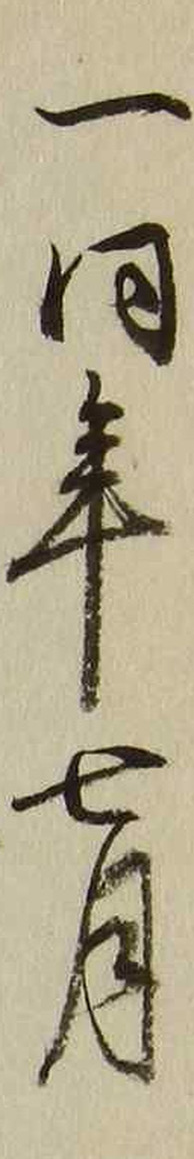一同年七月
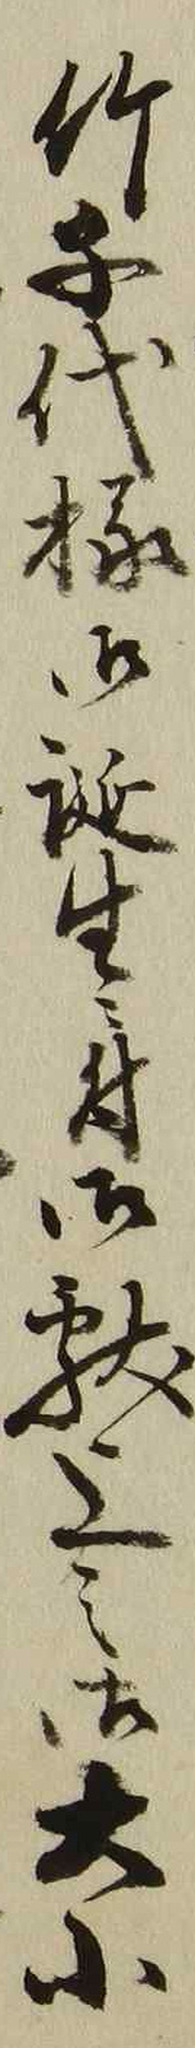竹子代様御誕生ニ付御献上之御大小
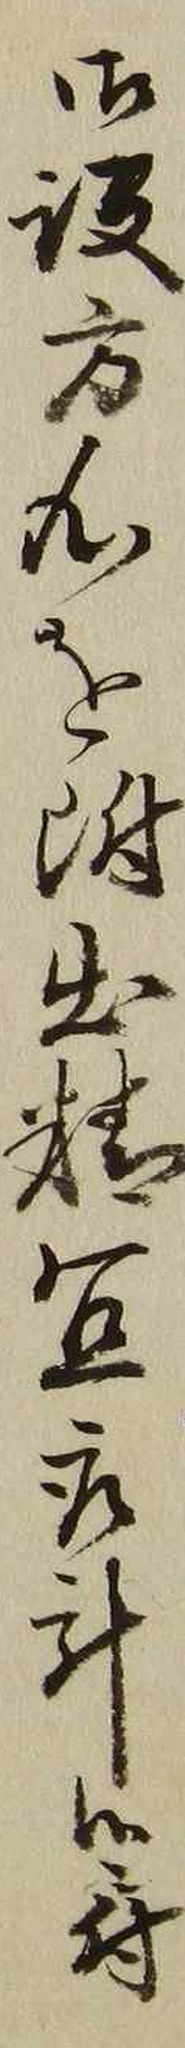御設方心を附出精宜取計候ニ付
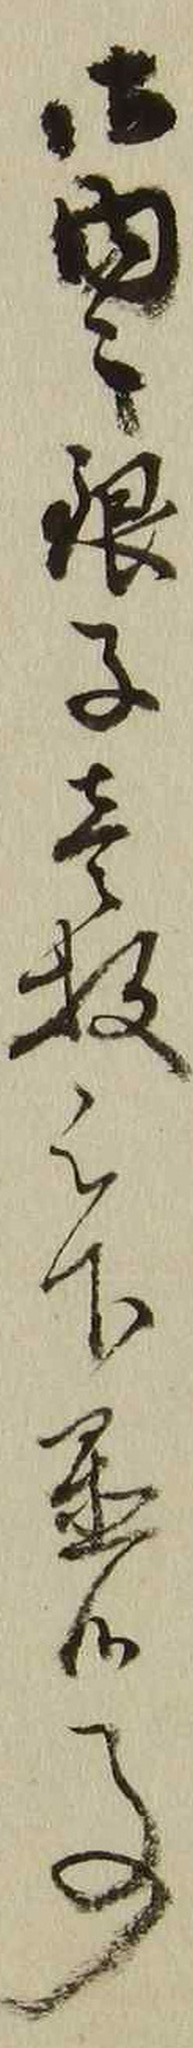御内々銀子壱枚被下置候事
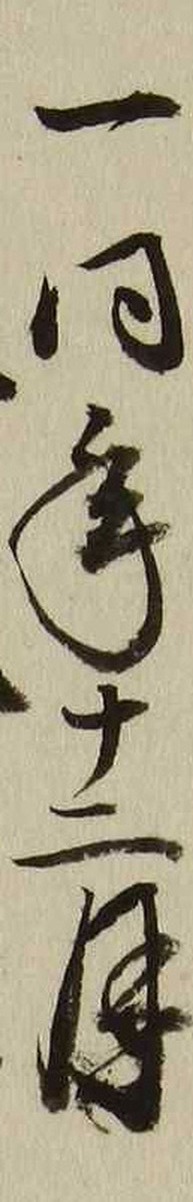一同年十二月
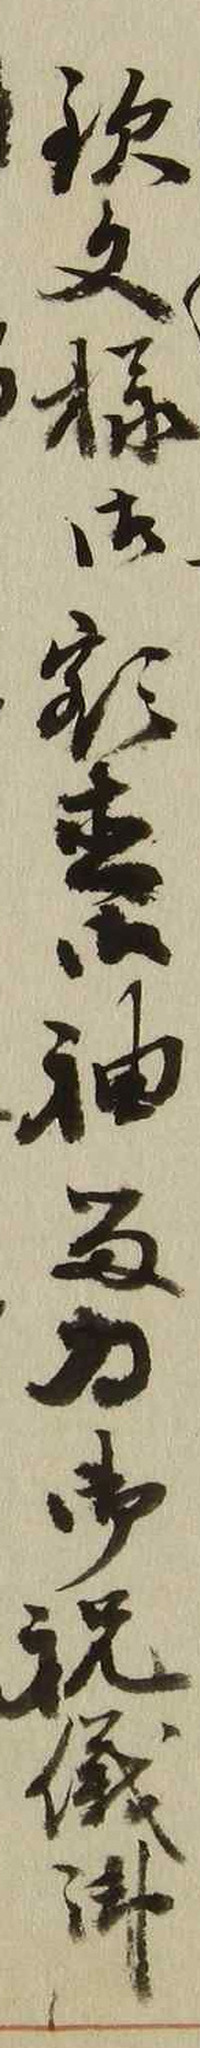欽文様御額直御袖留為御祝儀御
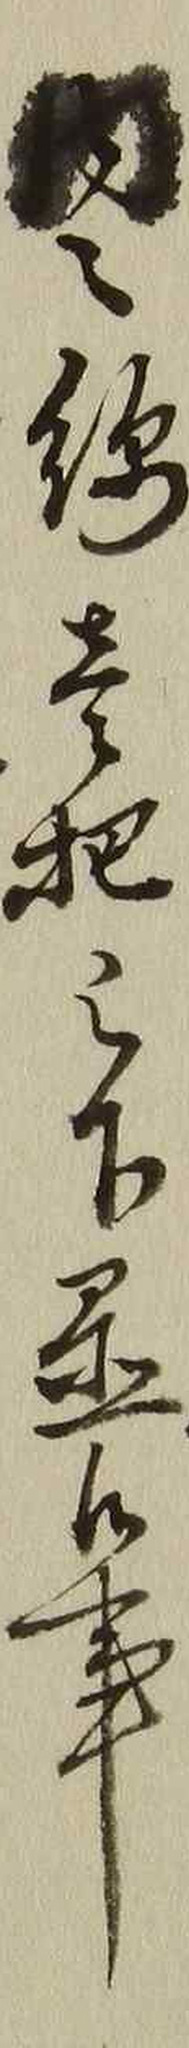内々綿壱把被下置候事
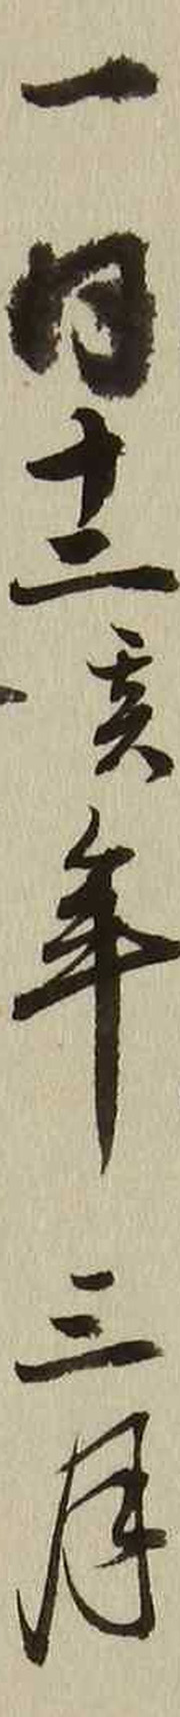一同十二亥年三月
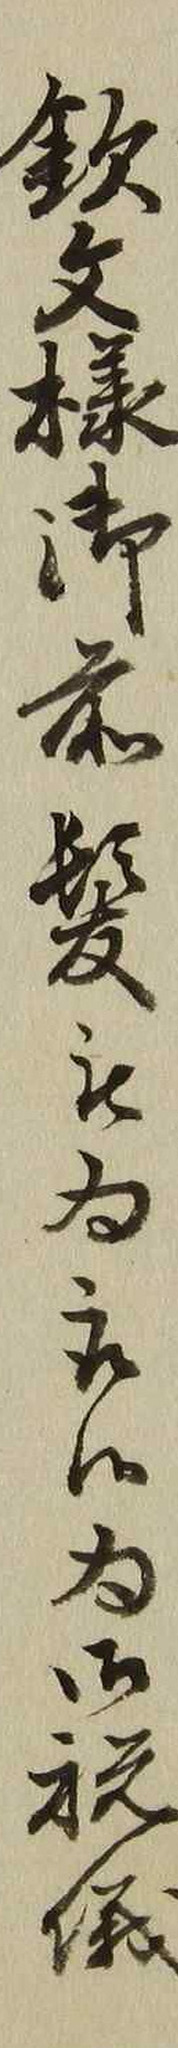欽文様御前髪被為取候為御祝儀
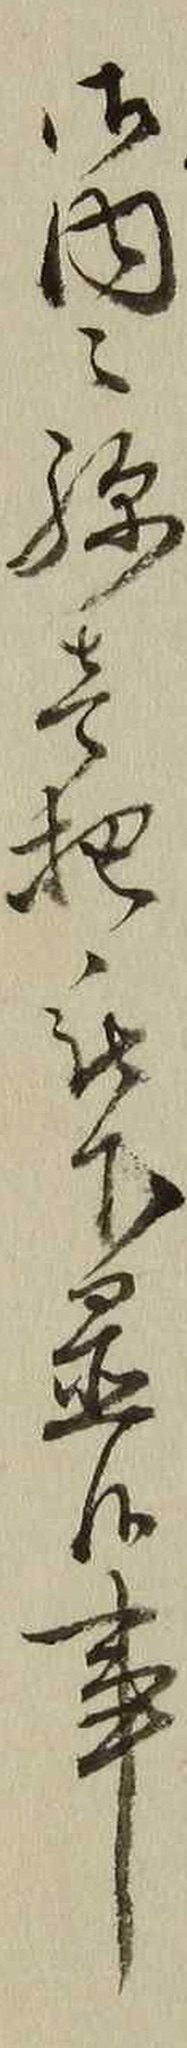御内々綿壱把被下置候事
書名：諸士系譜　巻之35　は之部3
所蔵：会津若松市立会津図書館
